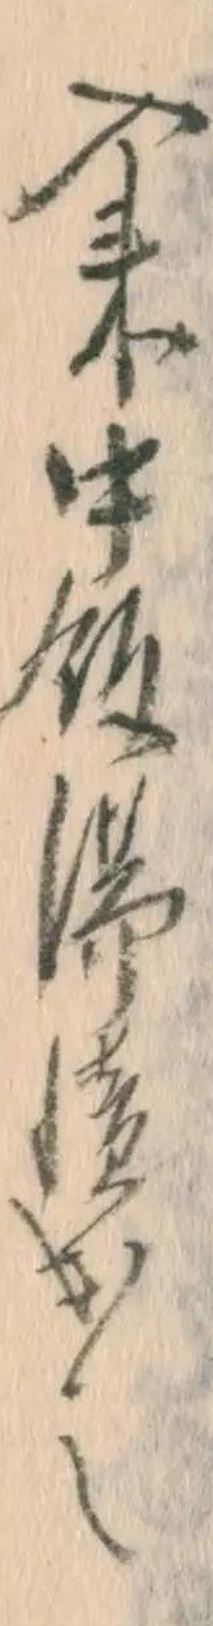入来中飯湯漬出也
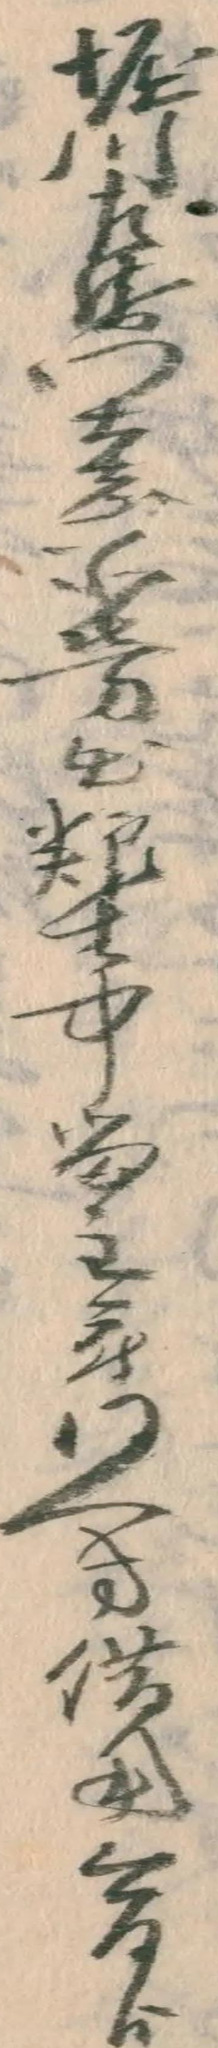堀川左衛門大志所労粮生中留主ニ付同人方借用今日ゟ
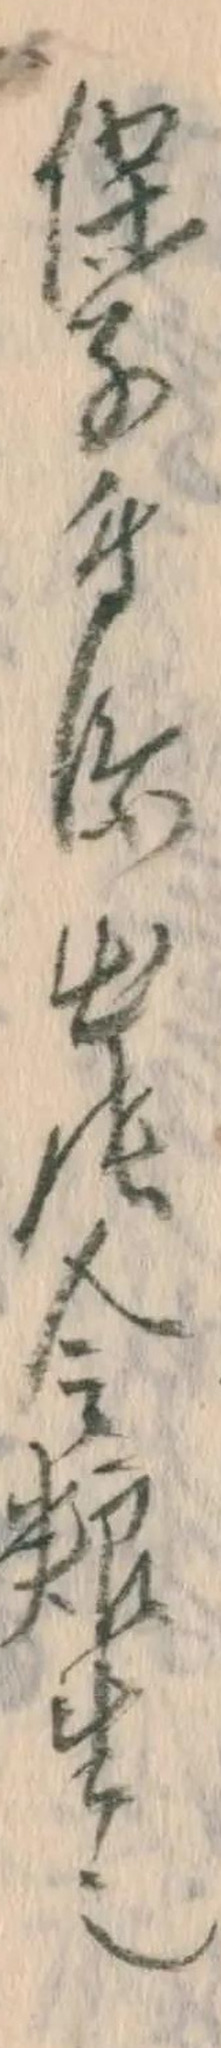保子付添出張令粮生也
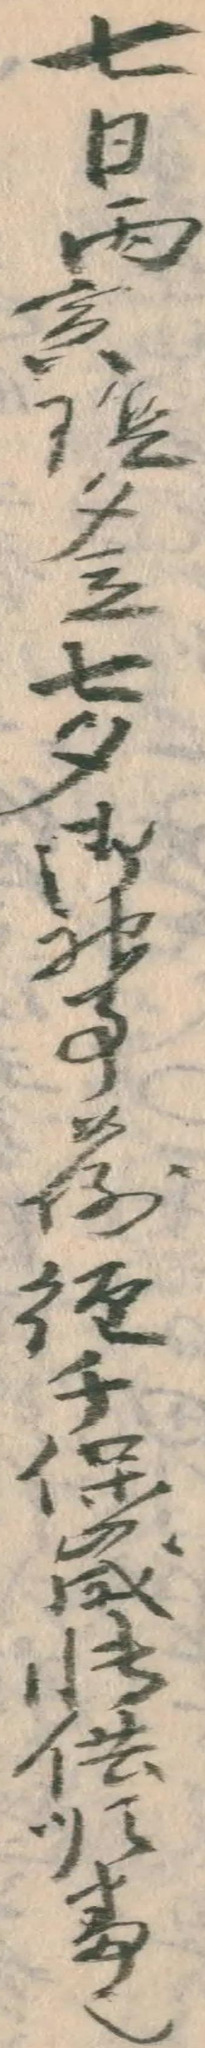七日丙寅陰夕立七夕御神事如例経千保歳轉供順番也
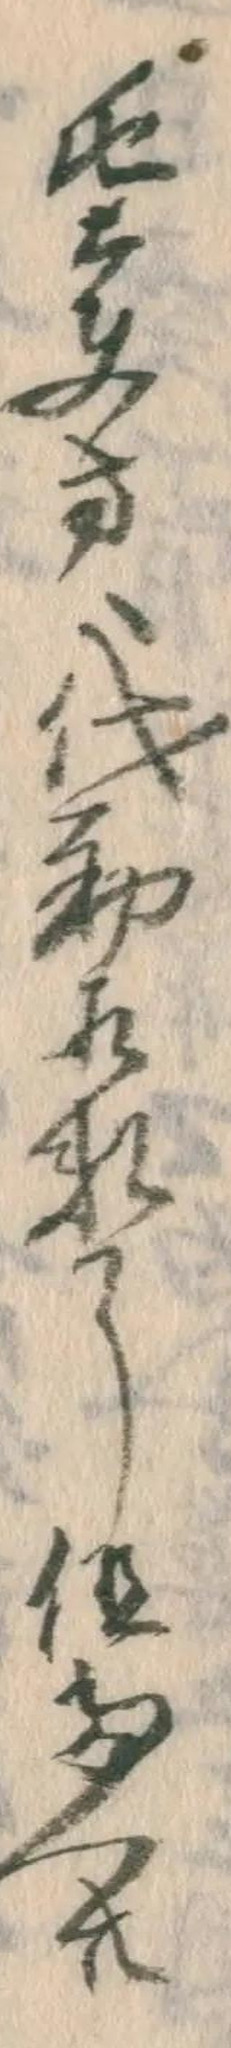屯大夫方へ代勤相頼了但両人共
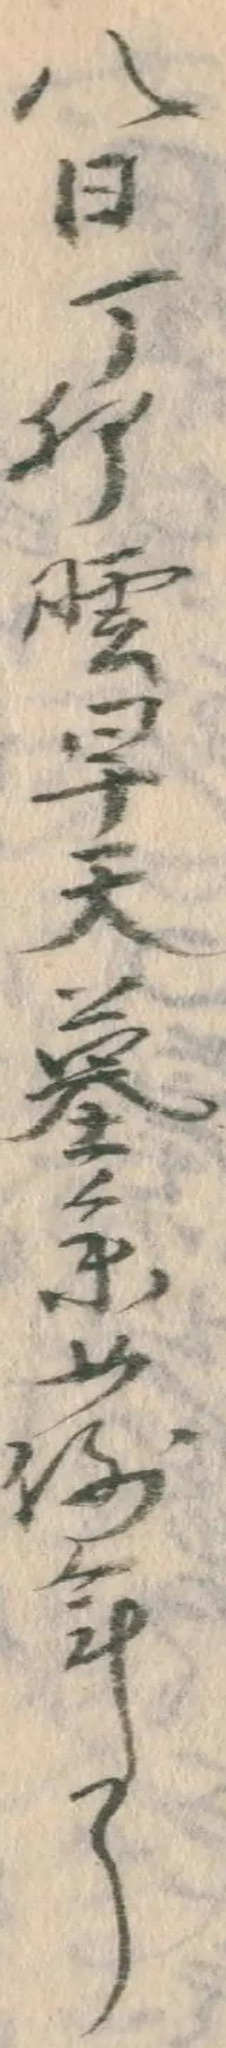八日丁卯曇早天墓参如例年了
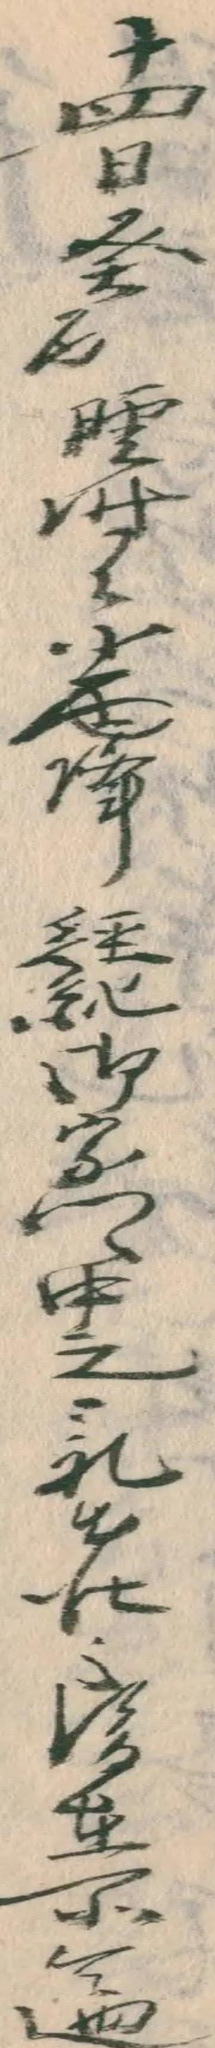十四日癸酉曇時々小雨降経紀御家門ヘ中元御礼出仕之後在所令廻
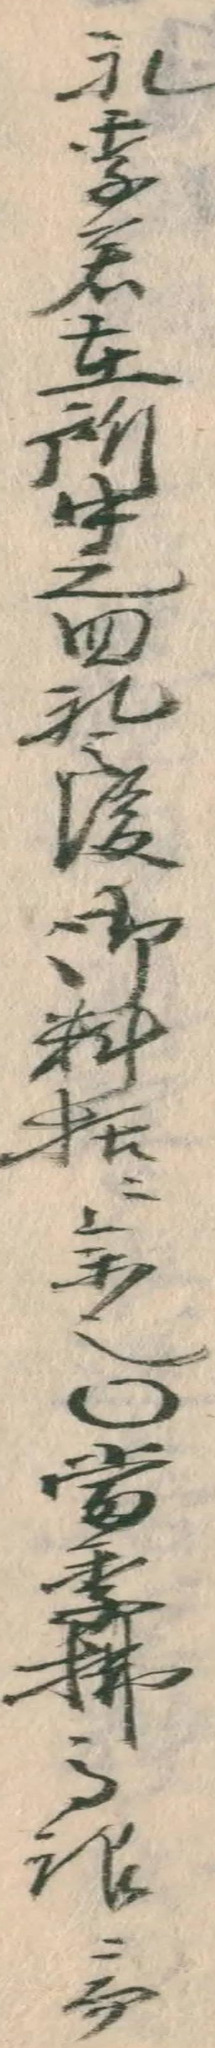礼季若在所中之回礼之後御料振ニ参也○當季払高銀ニ而
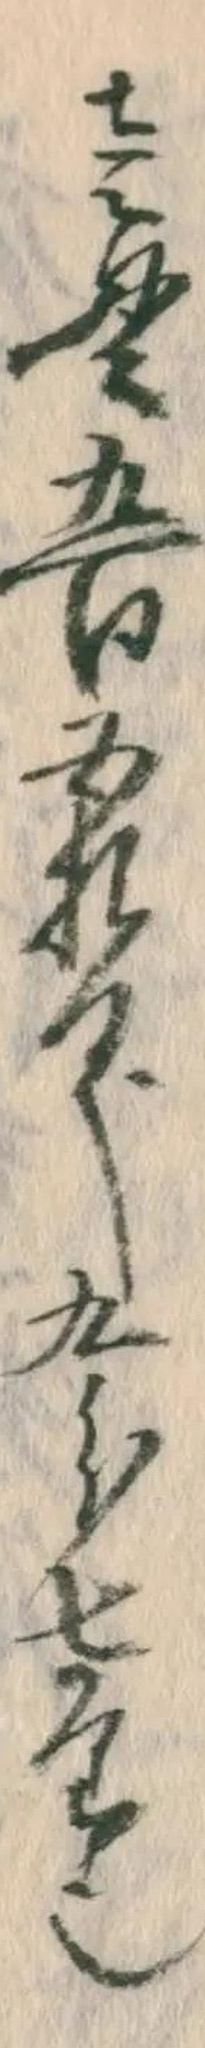壱貫五百五拾匁九分七厘也
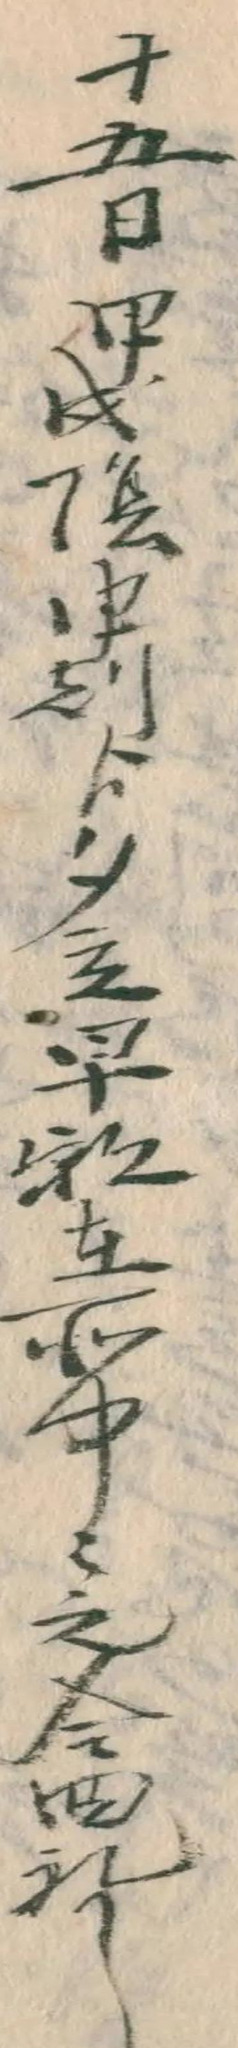十五日甲戌陰申刻ゟ夕立早朝在所中〻元令回礼了
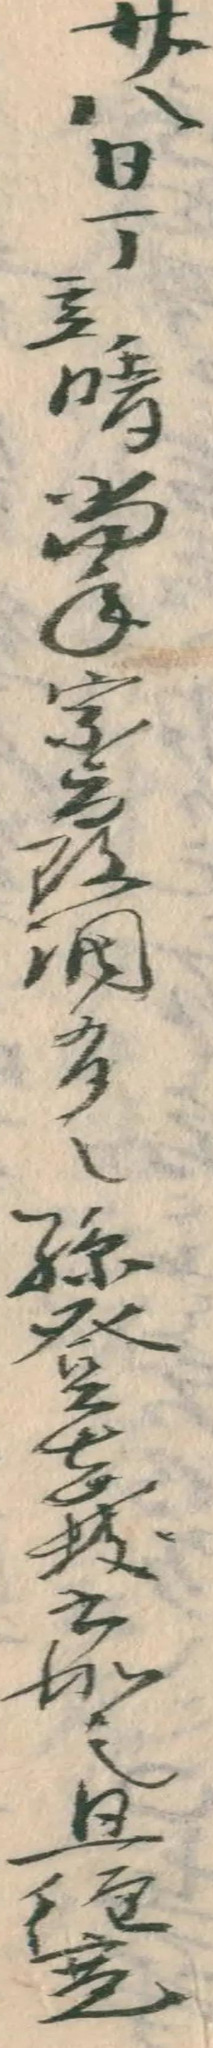廿八日丁亥晴當年宗旨改調有之孫登志枝無加也且経寛
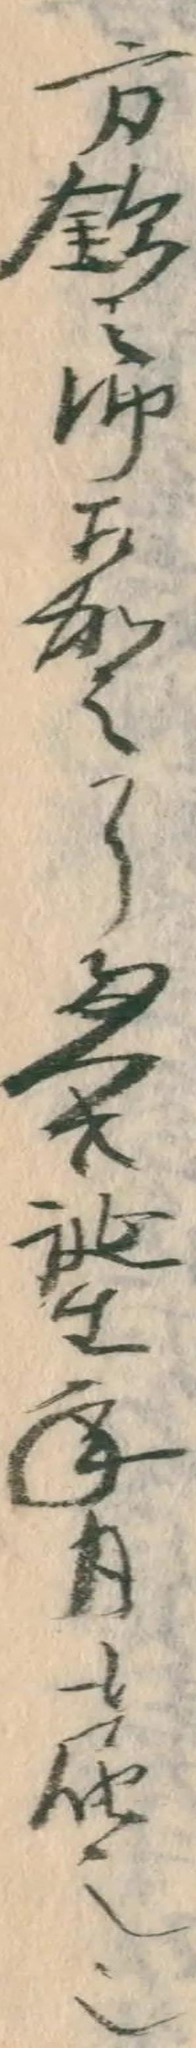方欽之助相加之了両人共誕生年月も届之也

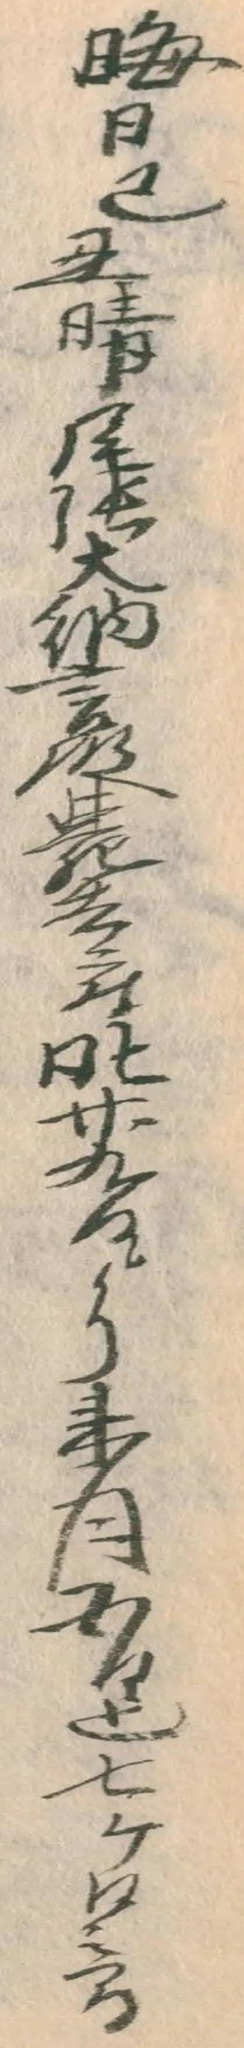晦日己丑晴尾張大納言殿薨去ニ付昨廿九日より来月五日迄七ケ日之間
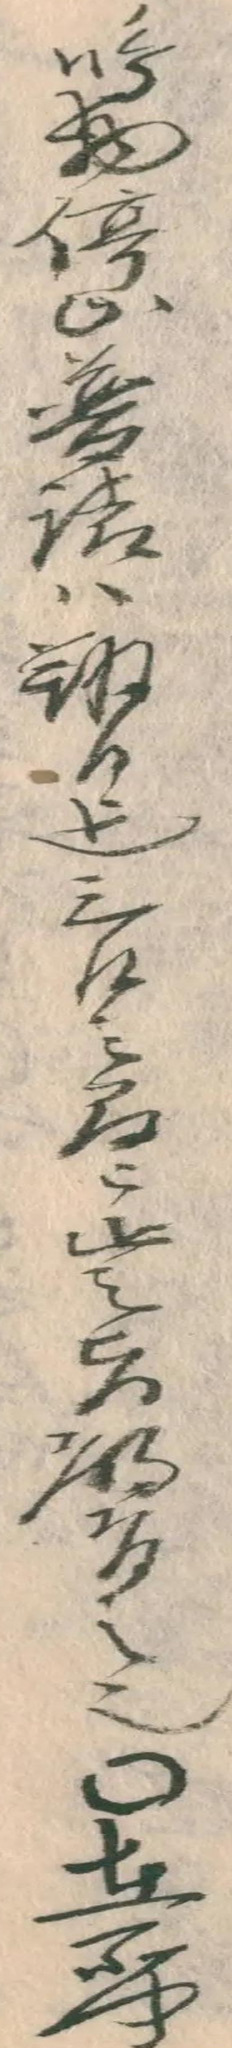鳴物停止普請は朔日迄三日之間に止之旨觸有之也○在所中
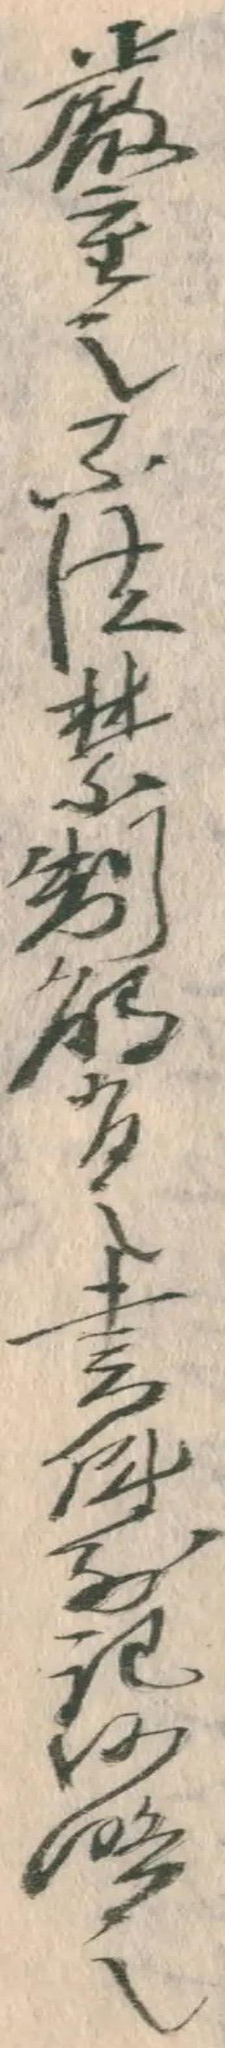厳重之不法禁制觸有之書附前記仍略之
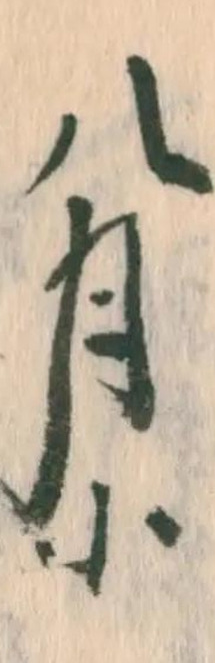八月小
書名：賀茂社記録. 第70冊
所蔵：国立国会図書館 National Diet Library, JAPAN
